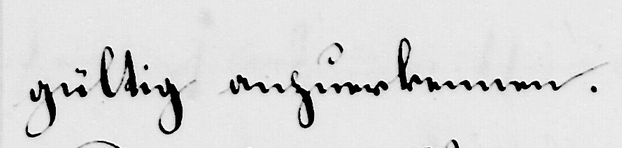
gültig anzuerkennen.
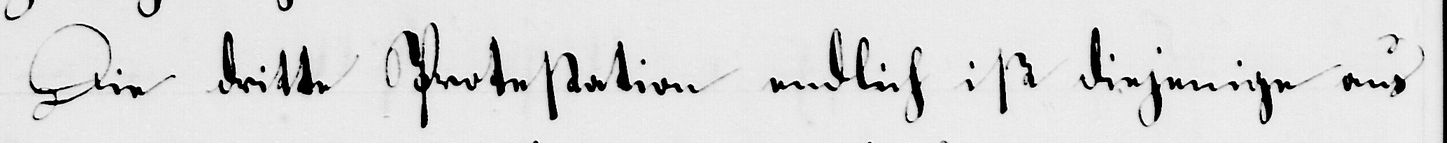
Die dritte Protestation endlich ist diejenige aus
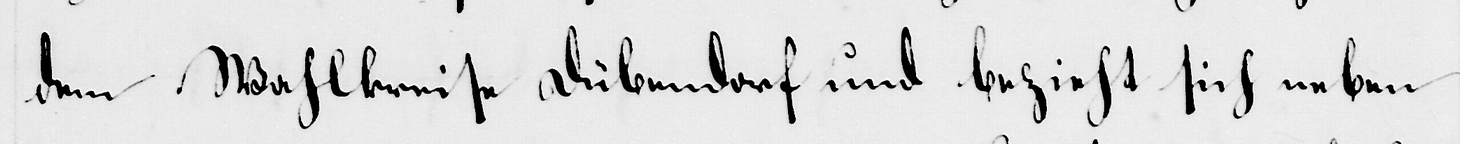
dem Wahlkreise Dübendorf und bezieht sich neben
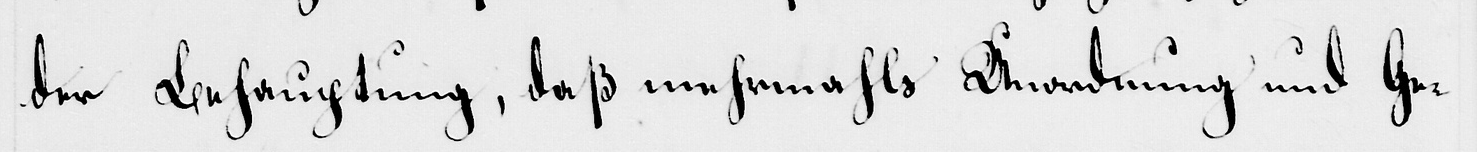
der Behauptung, daß mehrmahls Unordnung und Ge¬
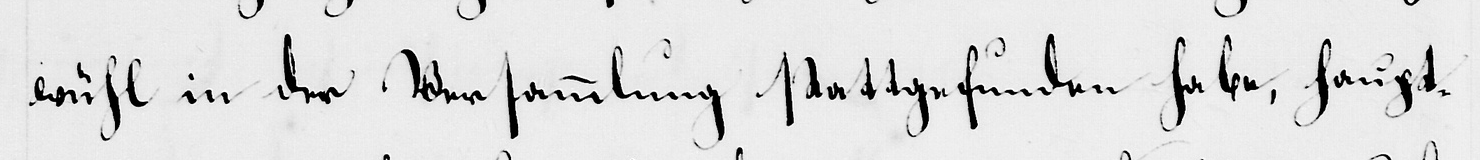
wühl in der Versammlung stattgefunden habe, haupt¬
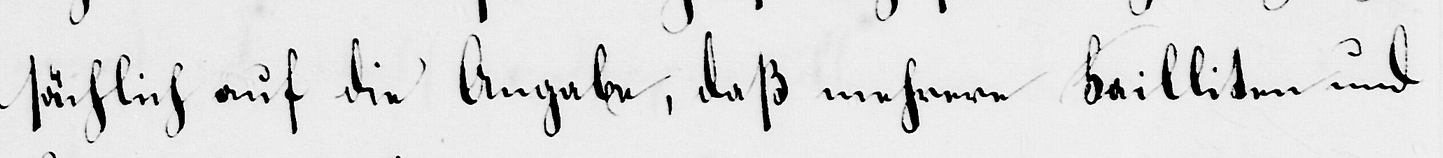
sächlich auf die Angabe, daß mehrere Failliten und
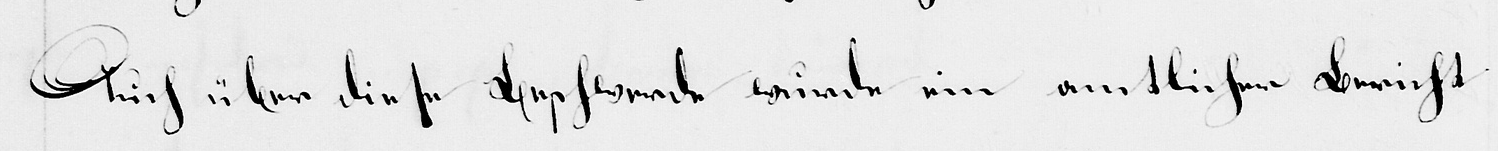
Auch über diese Beschwerde wurde ein amtlicher Bericht
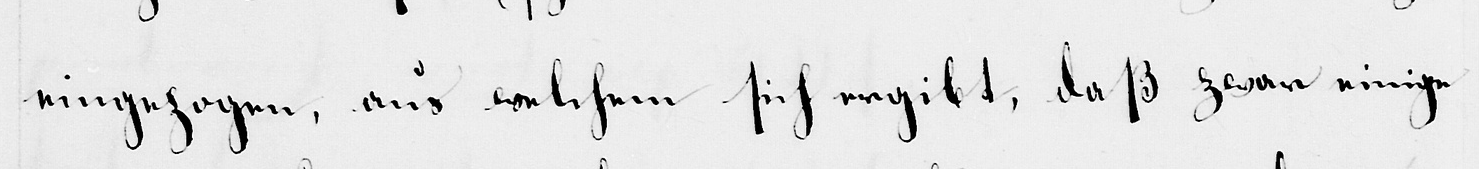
eingezogen, aus welchem sich ergibt, daß zwar einige
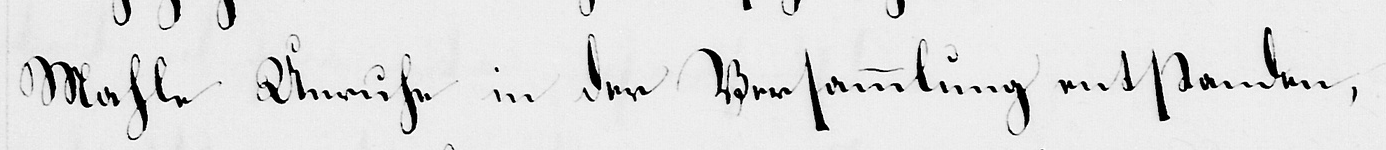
Mahle Unruhe in der Versammlung entstanden,
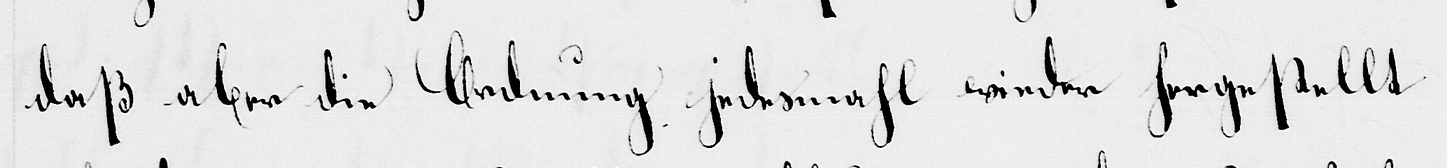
daß aber die Ordnung jedesmahl wieder hergestellt
